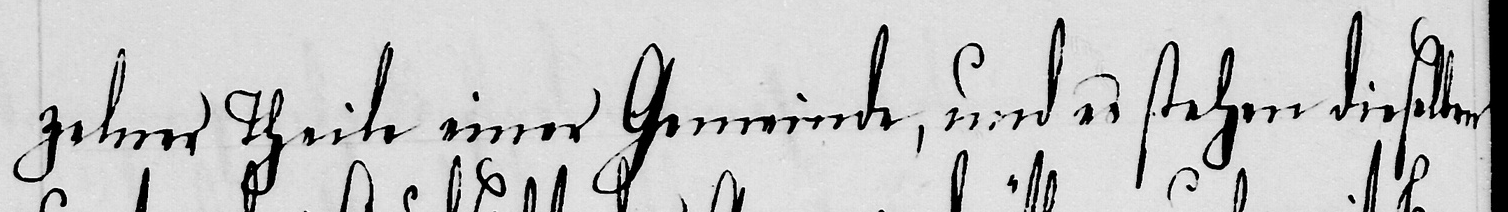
zelner Theile einer Gemeinde, und es stehen diesel¬
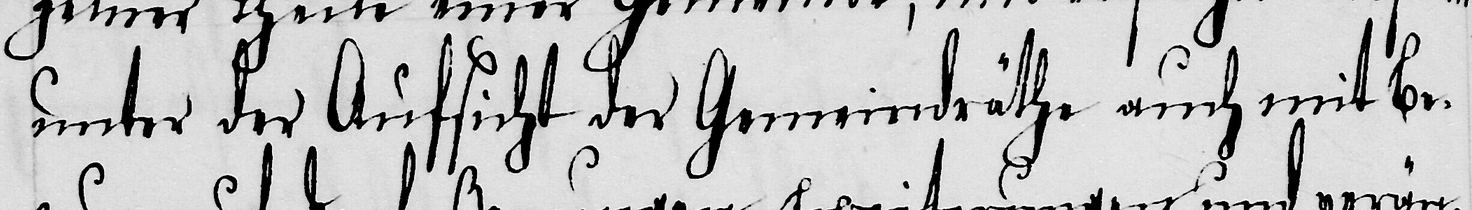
unter der Aufsicht der Gemeindräthe auch mit Be¬
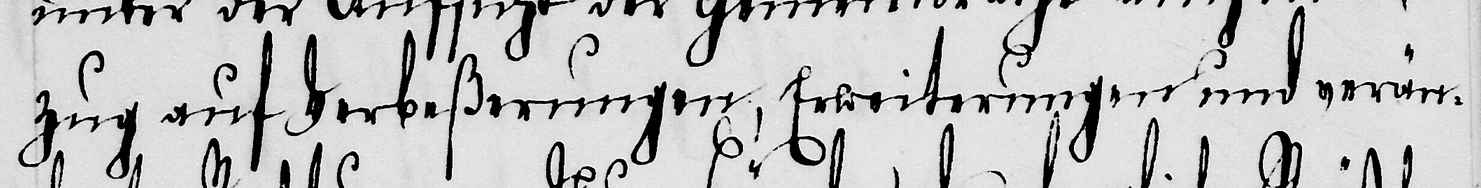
zug auf Verbeßerungen, Erweiterungen und verän¬
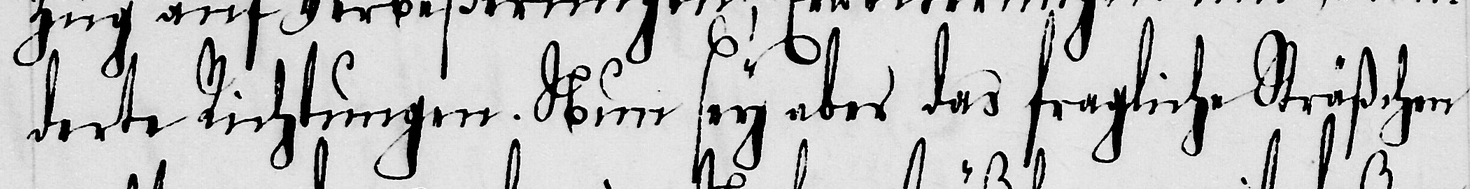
derte Richtungen. Nun sey aber das fragliche Sträßchen
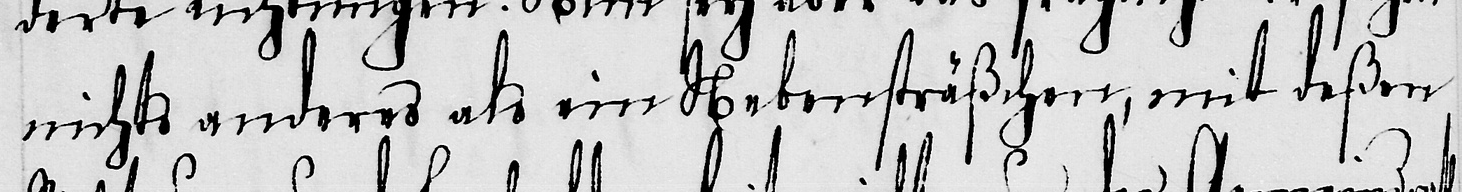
nichts anderes als ein Nebensträßchen, mit deßen
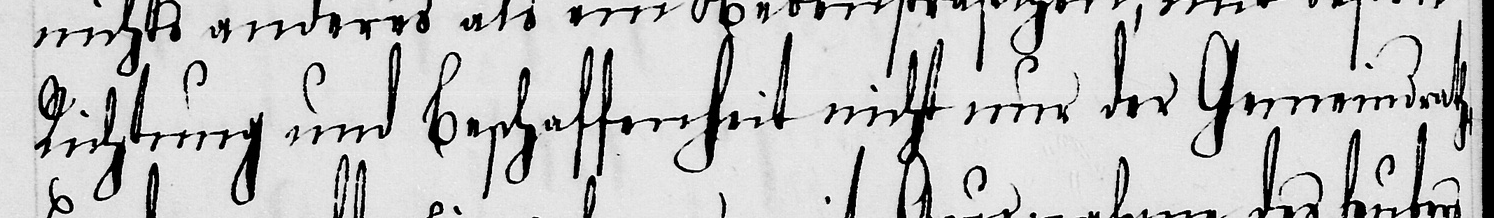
Richtung und Beschaffenheit nicht nur der Gemeindrath
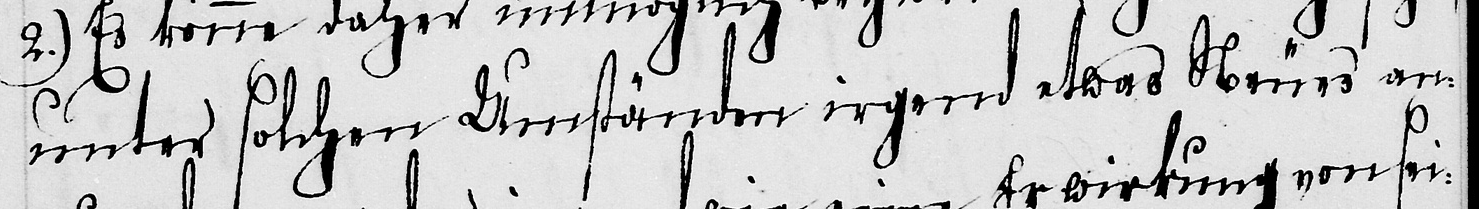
unter solchen Umständen irgend etwas Neues an¬
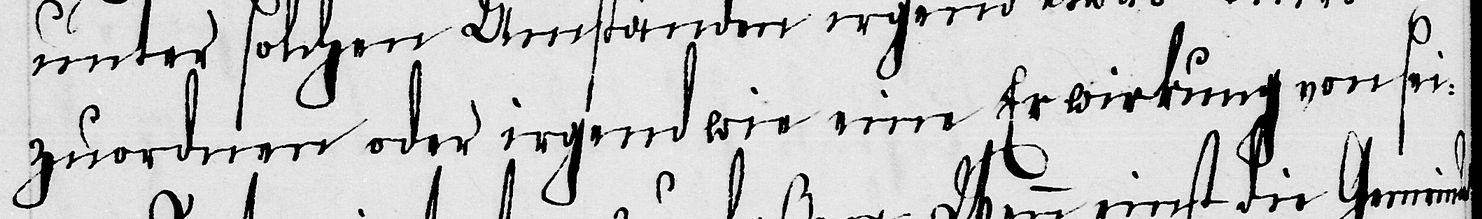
zuordnen oder irgendwie eine Erweiterung von sei¬
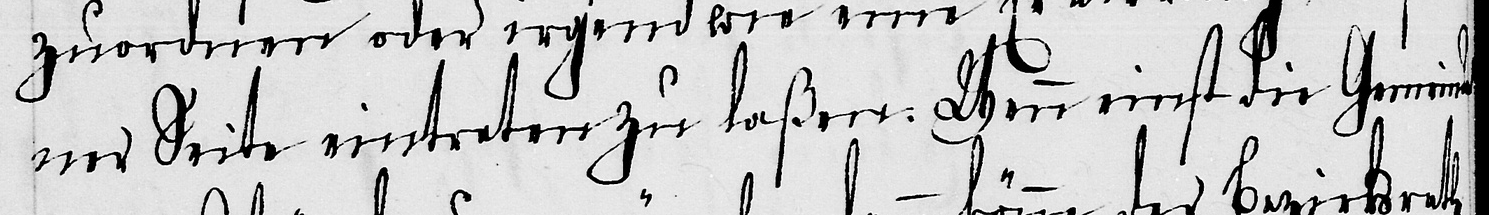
ner Seite eintreten zu laßen. Wenn einst die Gemei¬
